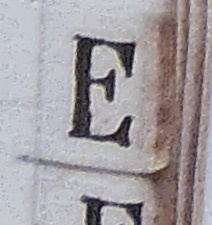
E
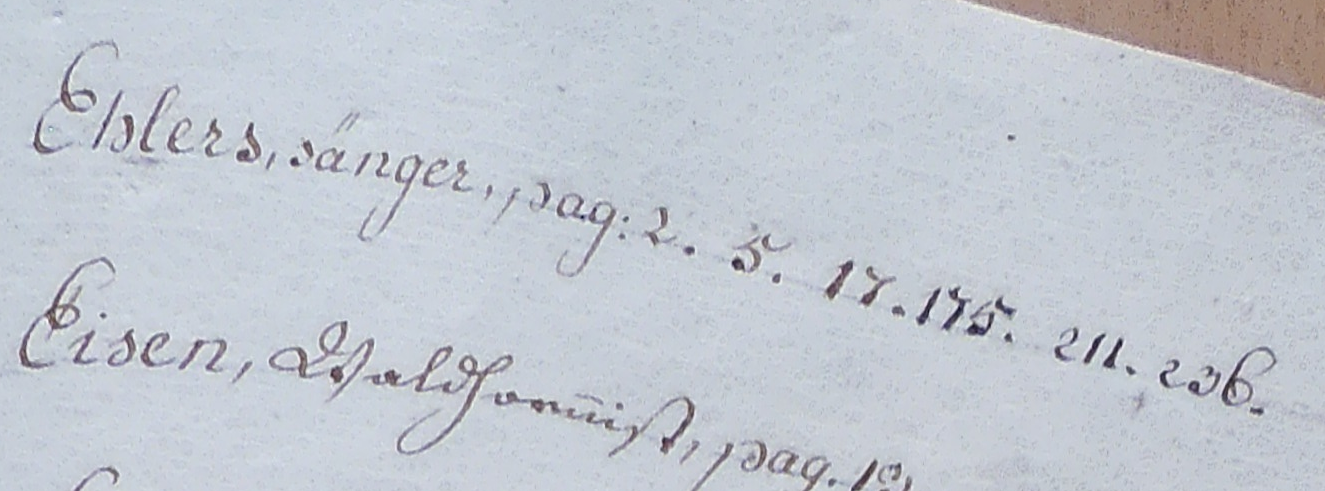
Ehlers, sänger, pag. 2. 5. 17. 175. 211. 236.
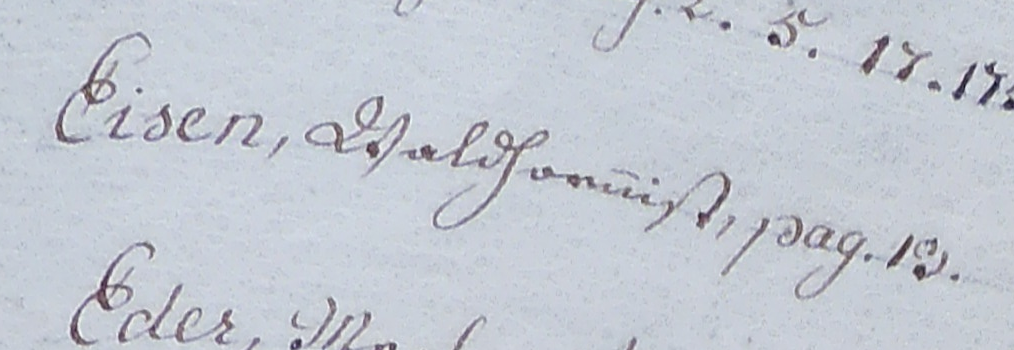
Eisen, Waldhornist, pag.13.
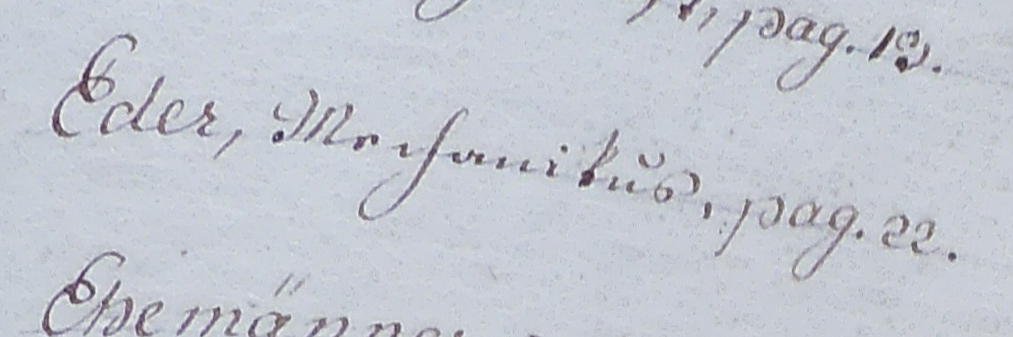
Eder, Mechanikus, pag. 22.
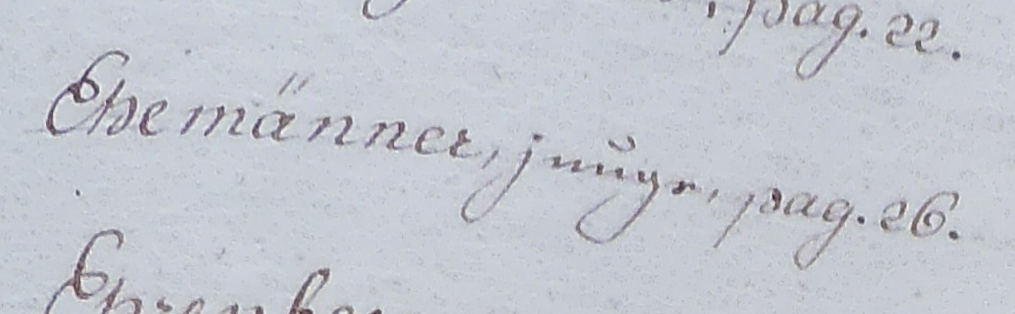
Ehemänner, junge, pag. 26.
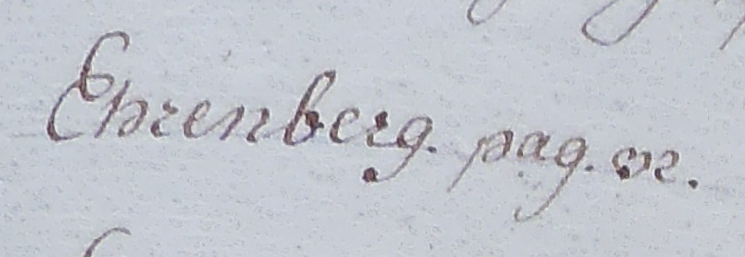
Ehrenberg. pag.32.
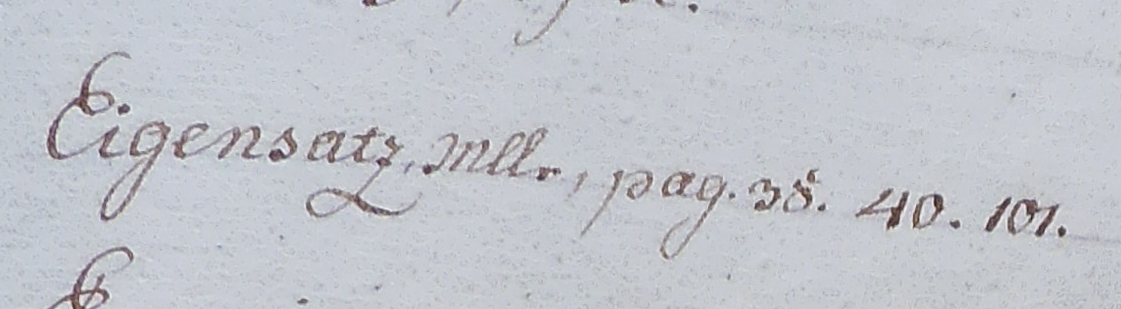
Eigensatz, Mlle, pag. 38. 40. 101.
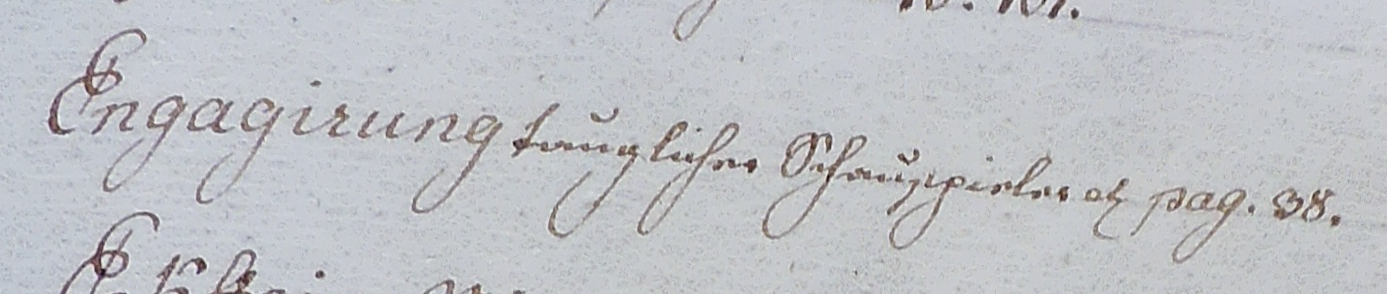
Engagirung tauglicher Schauspieler atq, pag. 38.
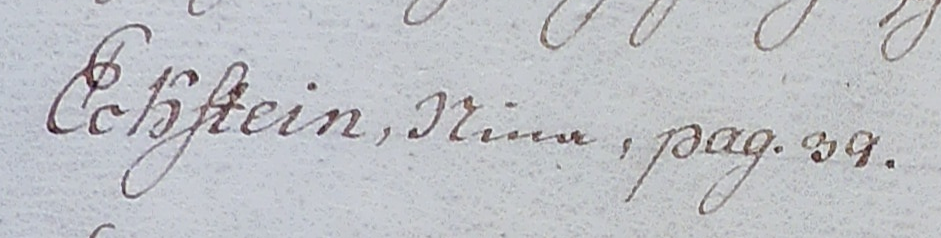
Eckstein, Nina, pag. 39.
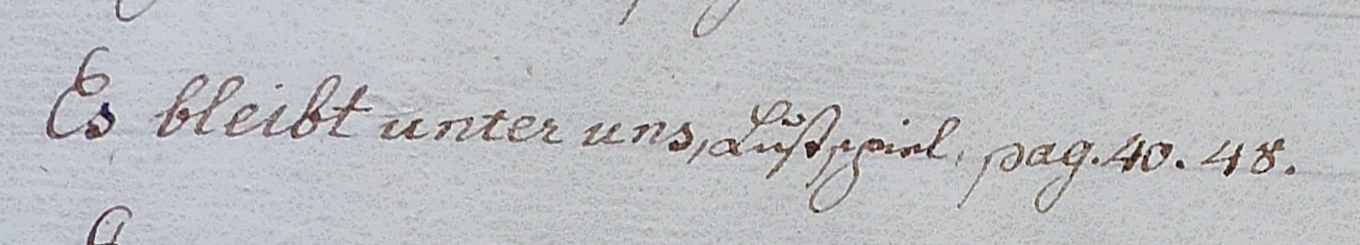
Es bleibt unter uns, Lustspiel, pag.40. 48.
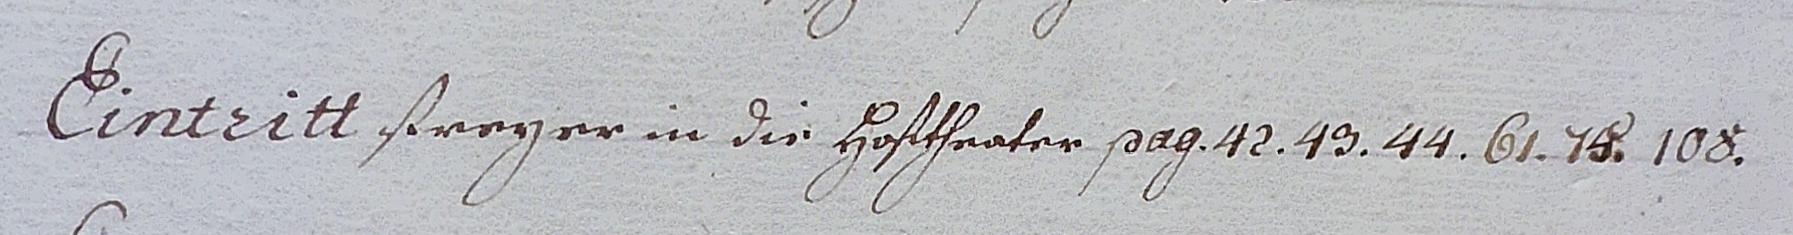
Eintritt freyer in die Hoftheater pag. 42. 43. 44. 61. 75. 108.
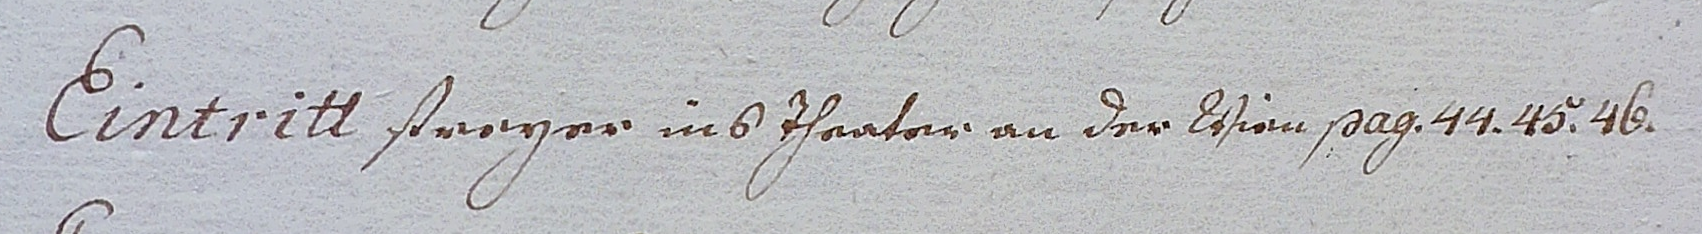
Eintritt freyer ins Theater an der Wien pag. 44. 45. 46.
